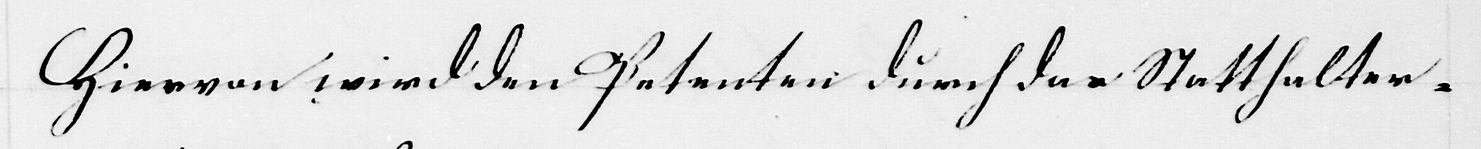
Hiervon wird den Petenten durch das Statthalter¬
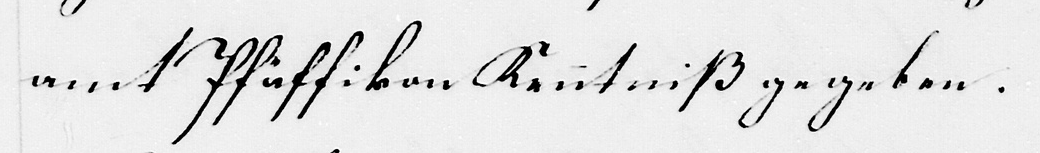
amt Pfäffikon Kenntniß gegeben.
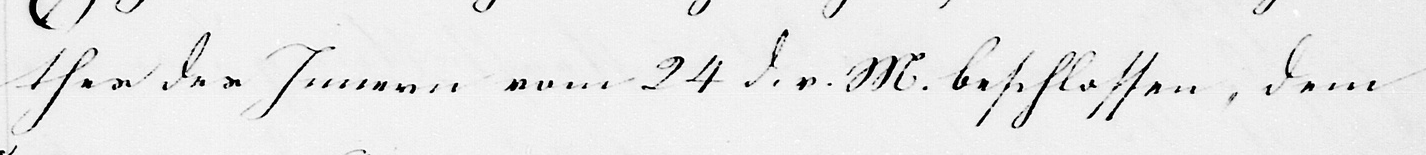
thes des Innern vom 24 d. v. M. beschlossen, dem
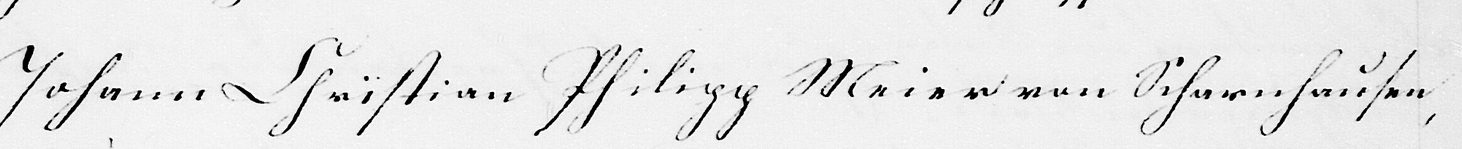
Johann Christian Philipp Meier von Scharnhausen,
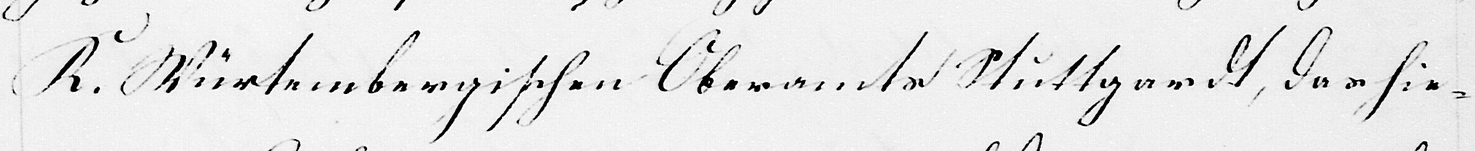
K. Würtembergischen Oberamts Stuttgardt, das hie¬
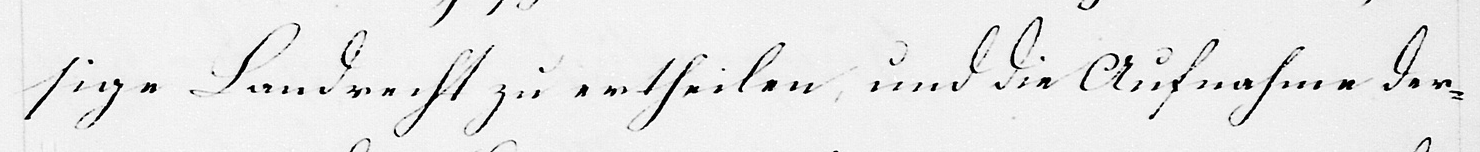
sige Landrecht zu ertheilen und die Aufnahme der¬
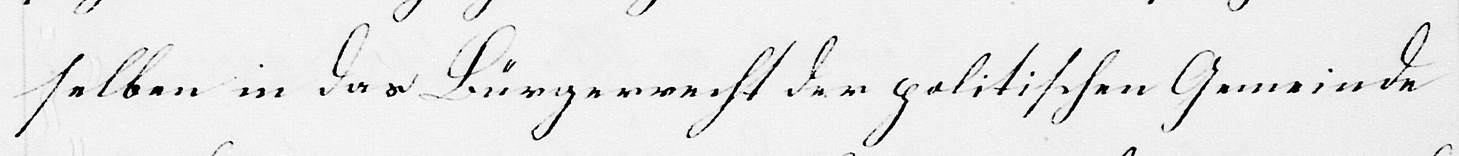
selben in das Bürgerrecht der politischen Gemeinde
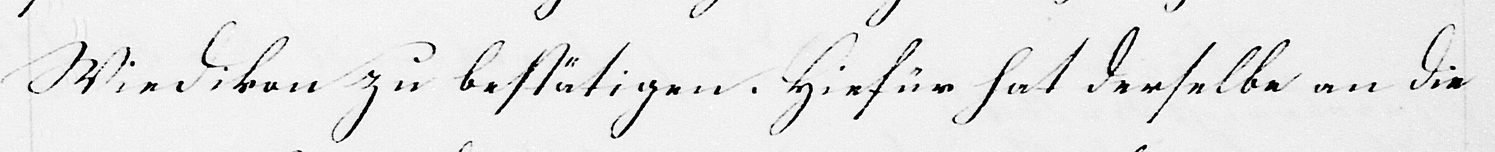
Wiedikon zu bestätigen. Hiefür hat derselbe an die
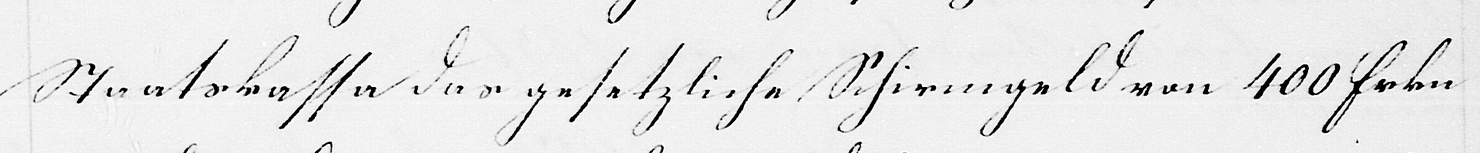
Staatskassa das gesetzliche Schirmgeld von 400 Frkn
